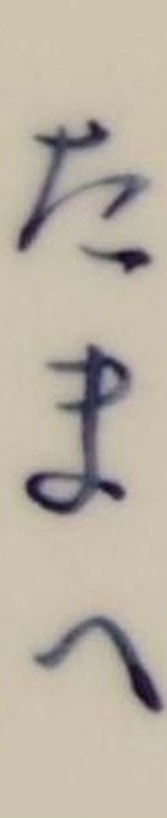たまへ
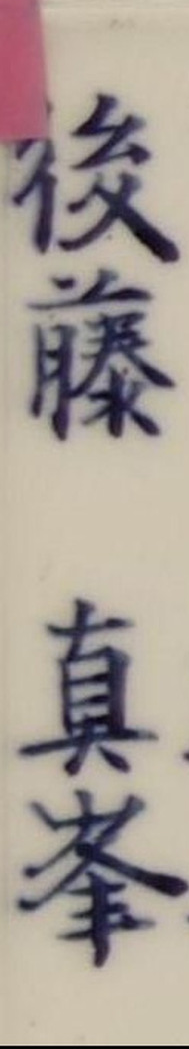後藤真峯

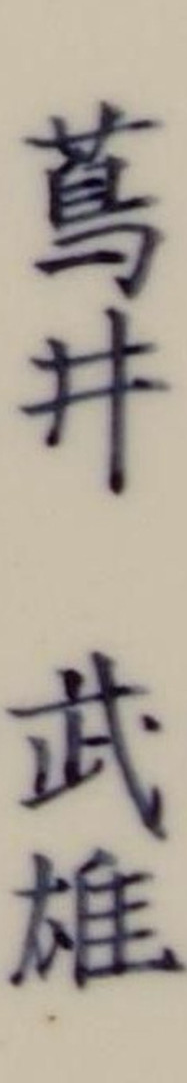蔦井武雄
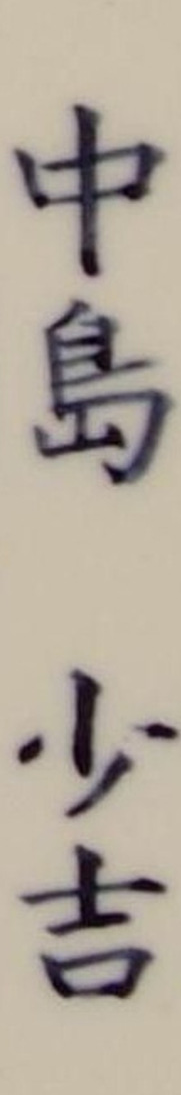中島少吉
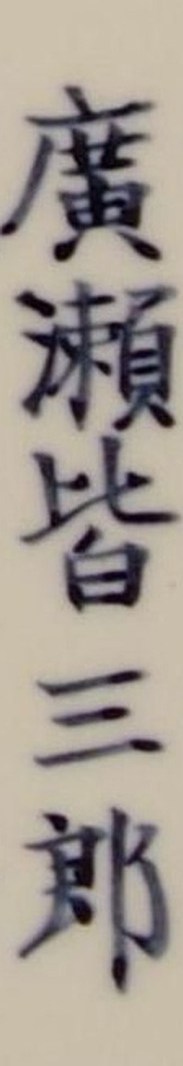廣瀬皆三郎
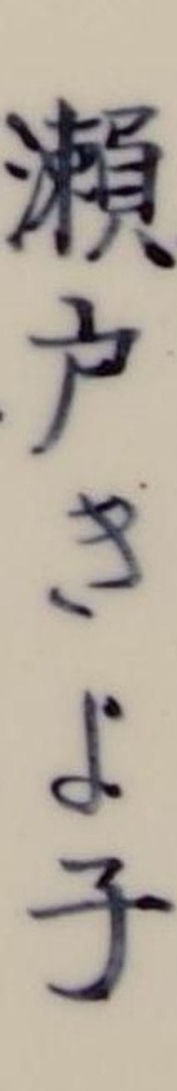瀬戸きよ子
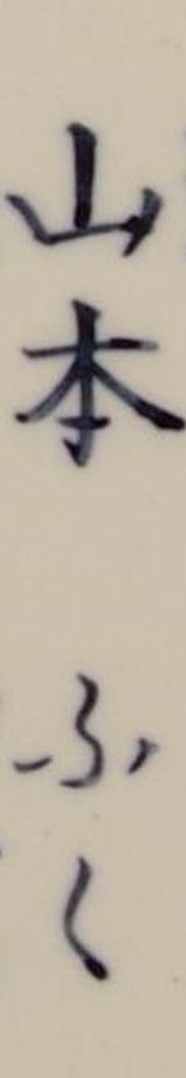山本ふく
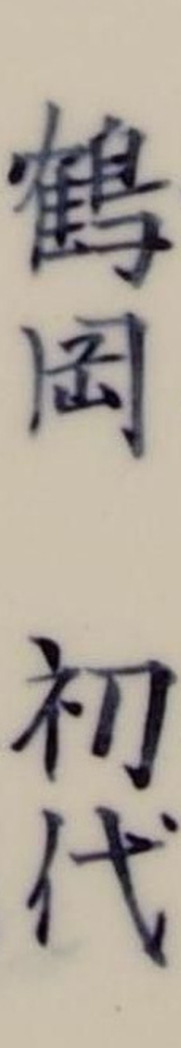鶴岡初代
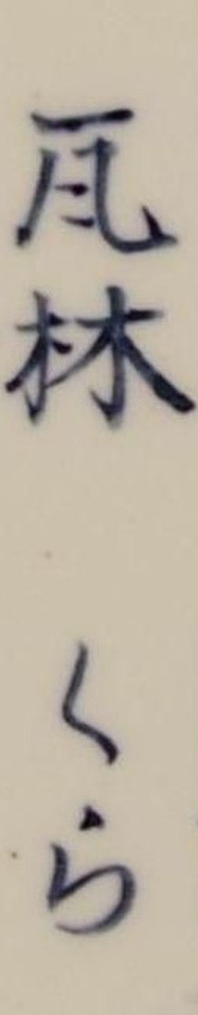瓦林くら
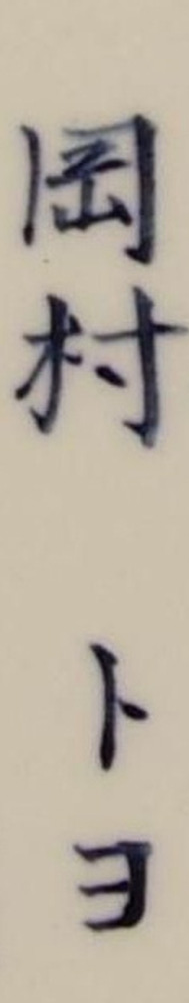岡村トヨ
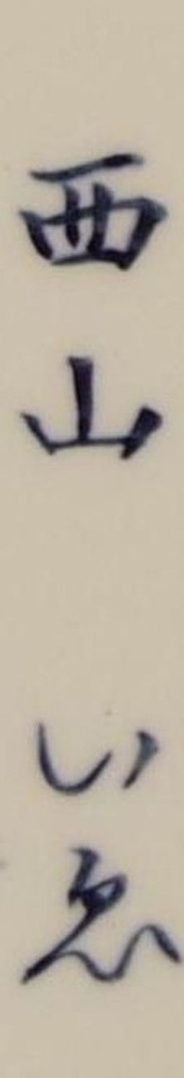西山いえ
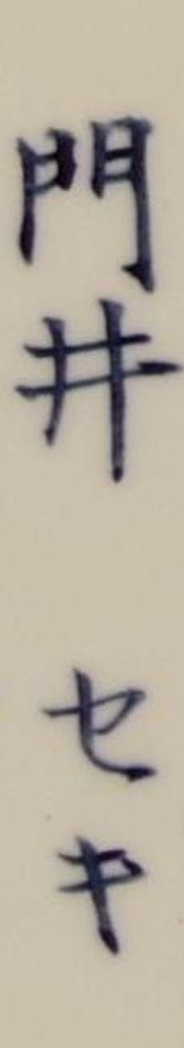門井セキ
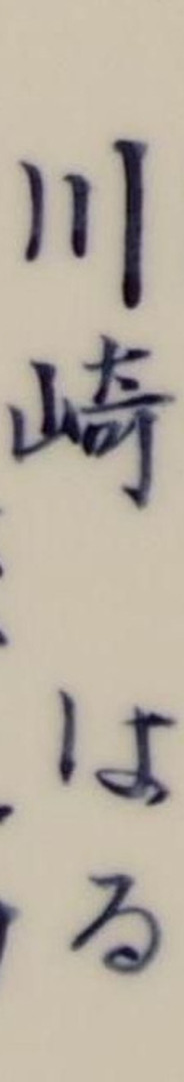川崎はる
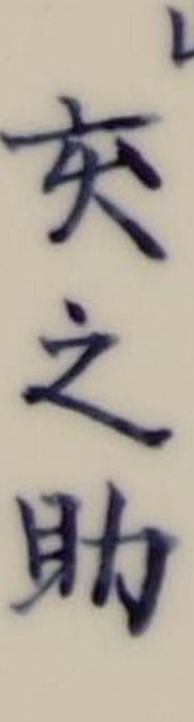充之助
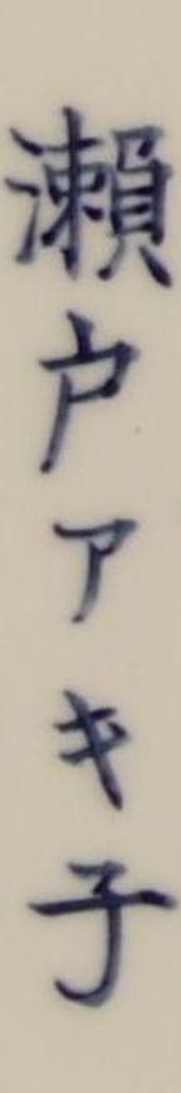瀬戸アキ子

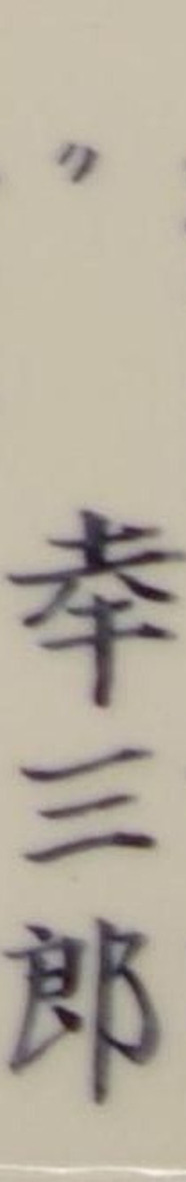幸三郎
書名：M~S
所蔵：高野山金剛峯寺
